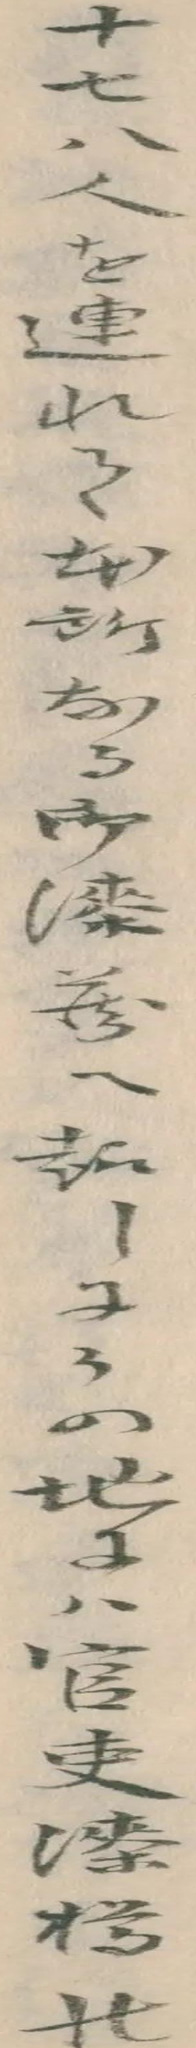十七八人を連れて本所なる御漆蔵へ趣しにかの地には官吏漆樽の

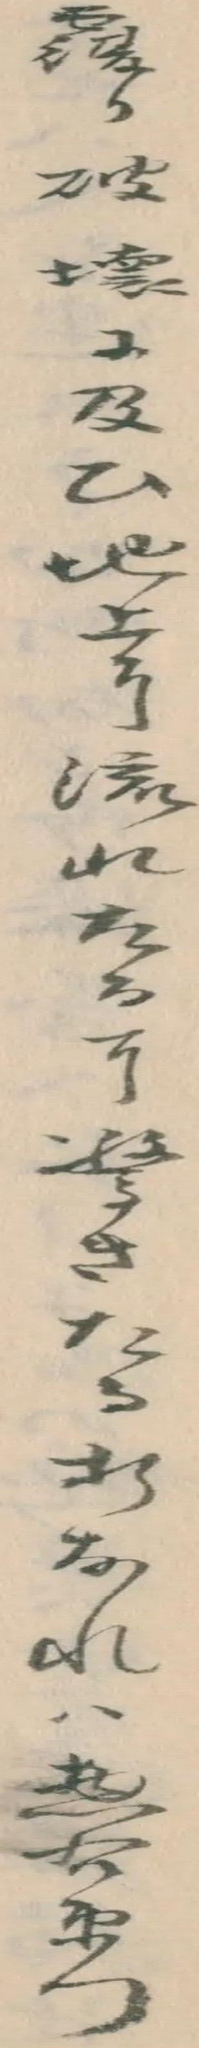覆り破壊に及ひ地上に流れたるに驚きたる折なれは惣右衛門
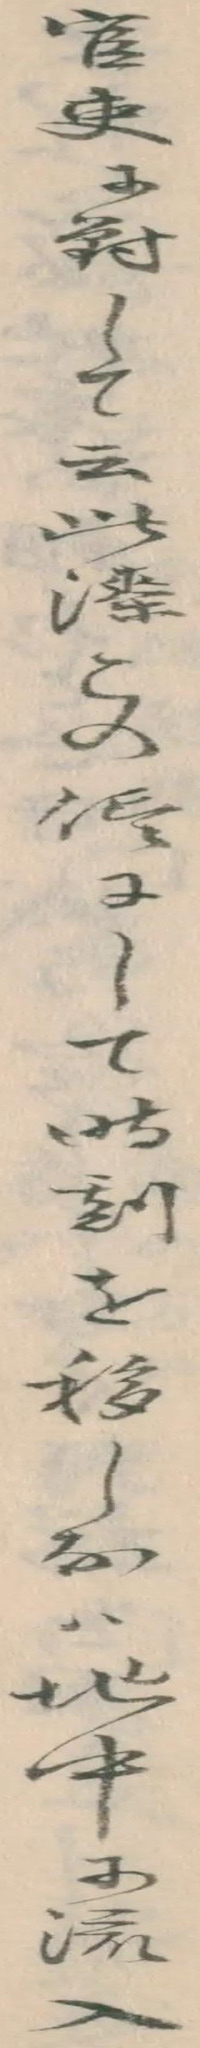官吏に対して云此漆この侭にして時刻を移しなは地中に流入
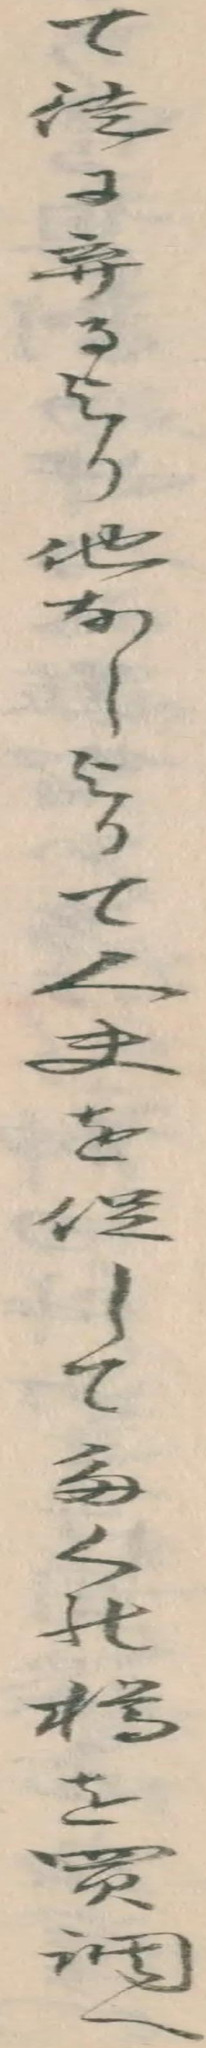て徒に弃るより他なしよりて人夫を促して多くの樽を買調へ
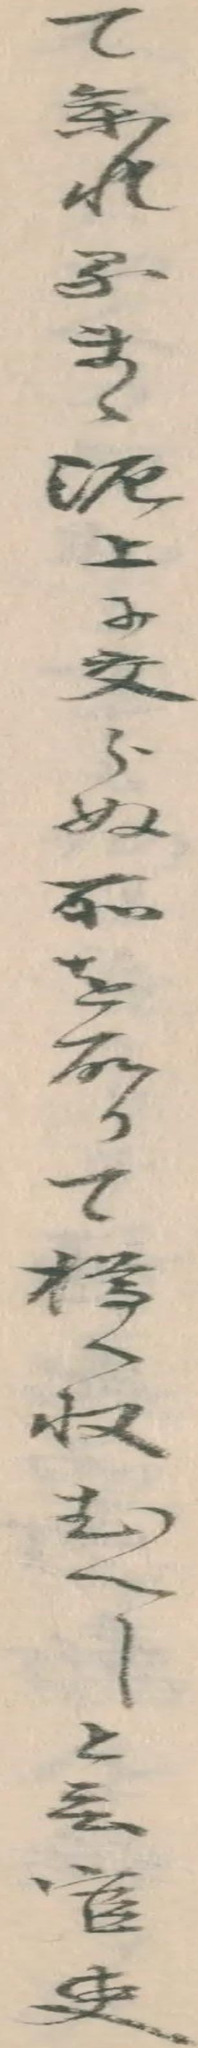て参れるまゝ泥上に交らぬ所を取りて樽へ収むへしと云官吏
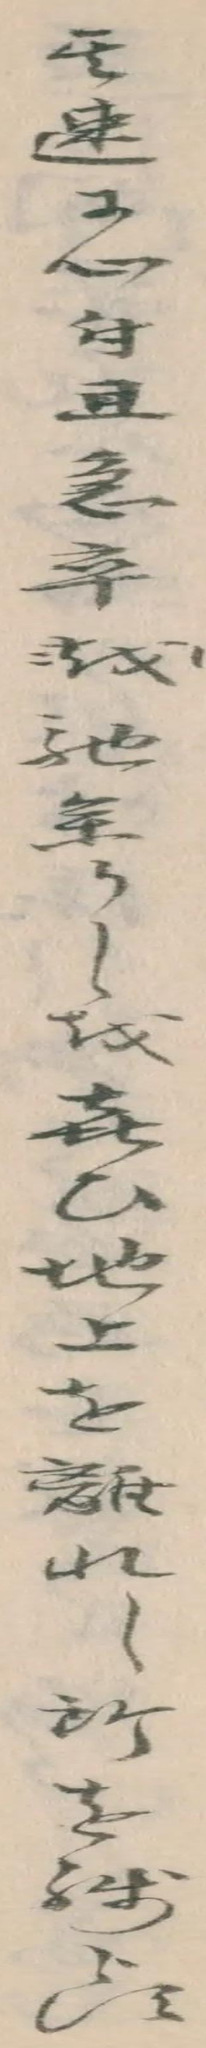其速に心付且急卒を馳参りしを喜ひ地上を離れし所を残らす
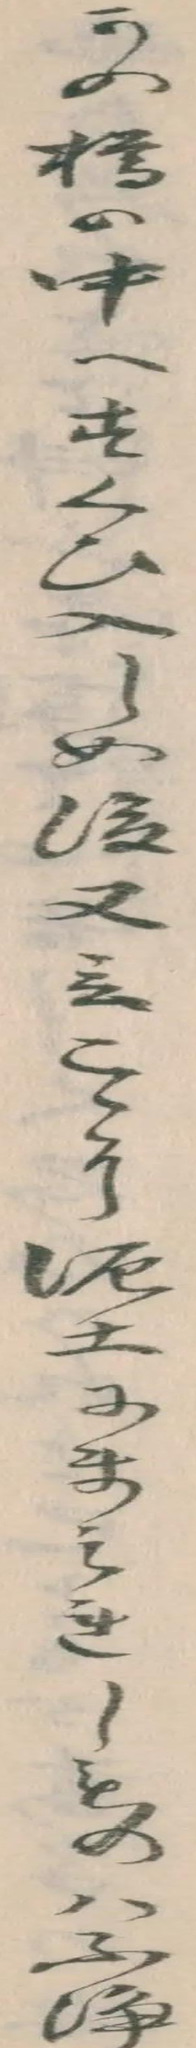かの樽の中へすくひ入しめ後又云こゝに泥土にまみれしものは不浄
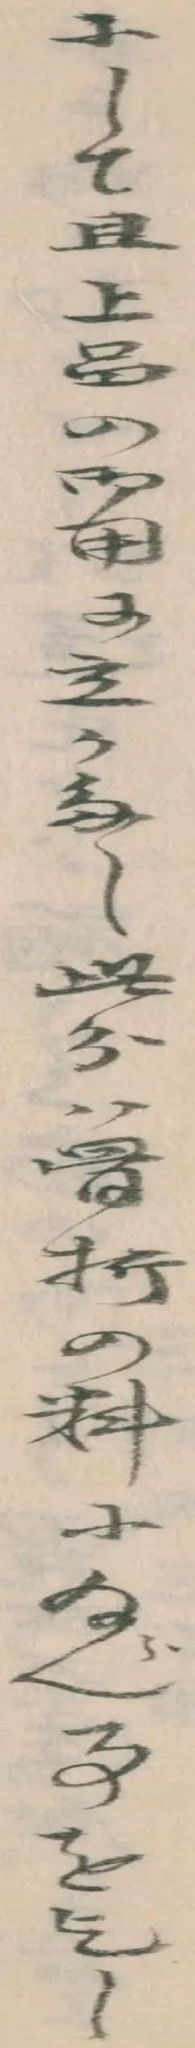にして且上品の御用に立かたし此分は骨折の料にゐらん事を乞し
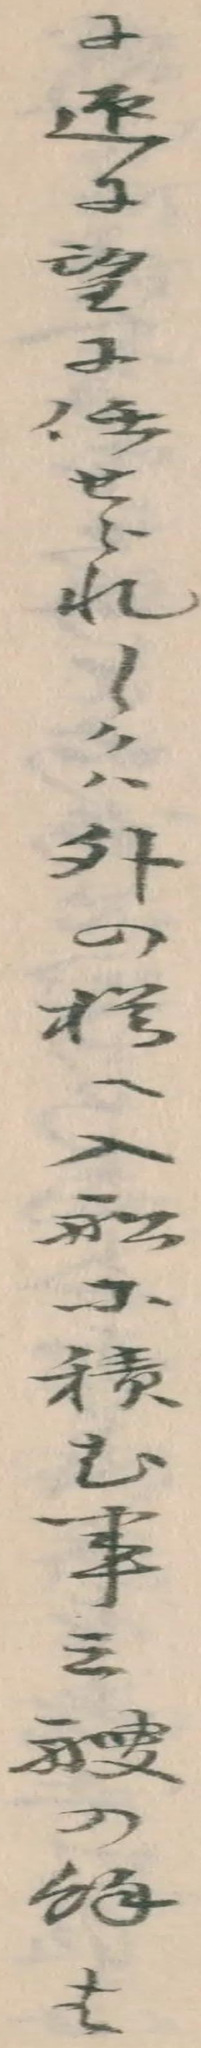に迎に望に任せられしかは外の樽へ入船に積む事三艘の余は
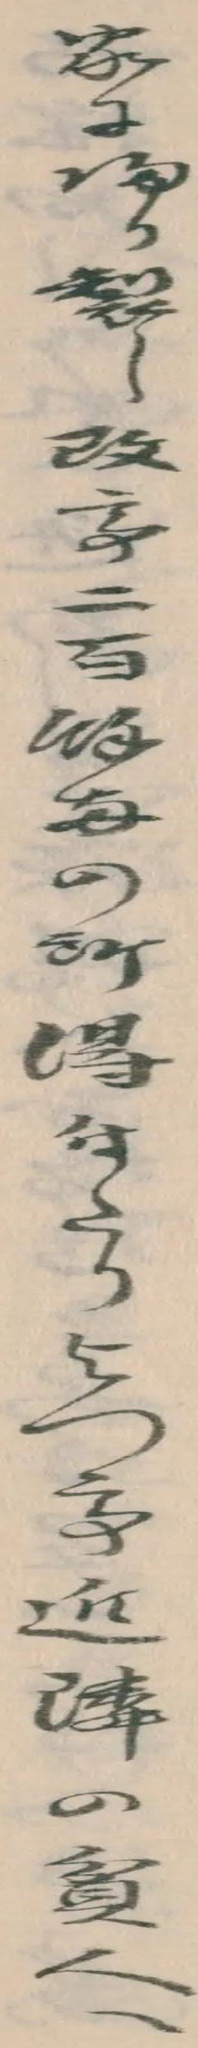家に帰り製し改て二百余両の所得付たりよって近隣の貧人へ
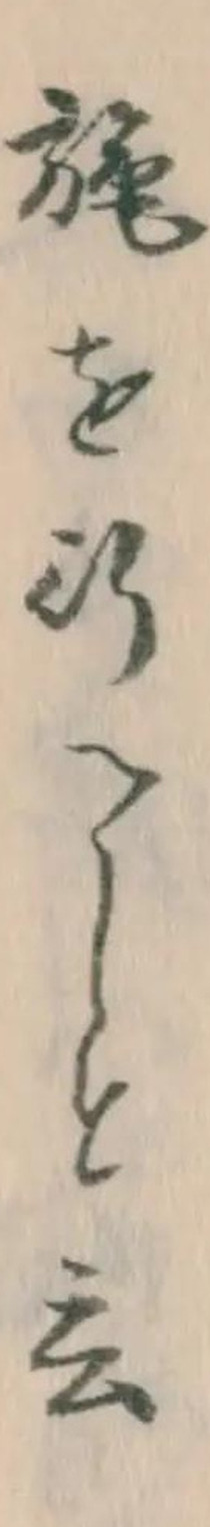施を行へしと云
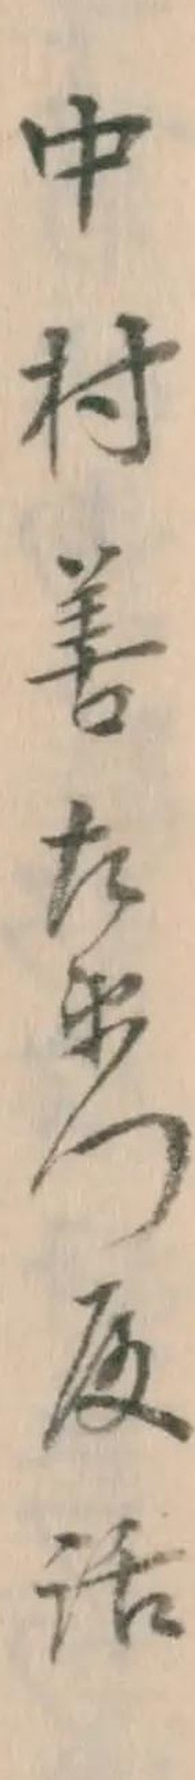中村善左衛門殿話
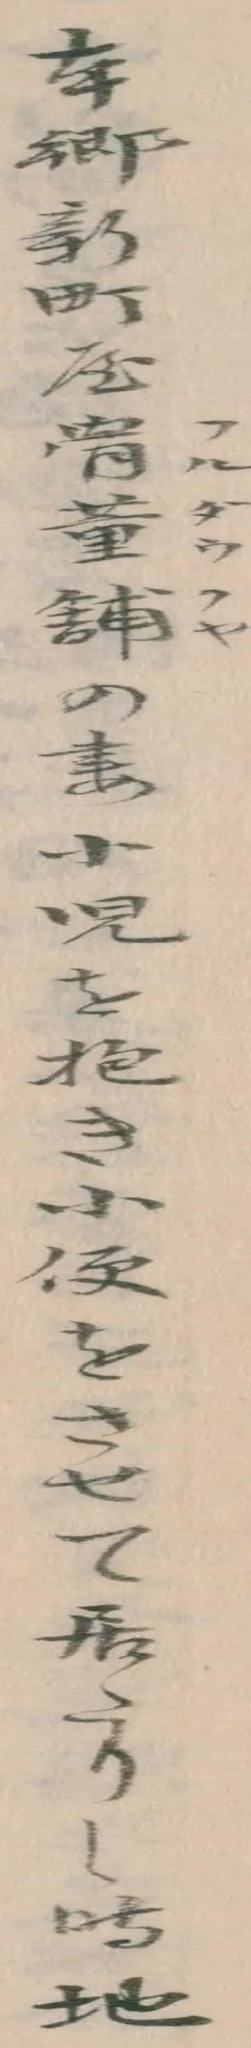〇本郷新町屋骨董舗の妻小児を抱き小便をさせて居たりし時地
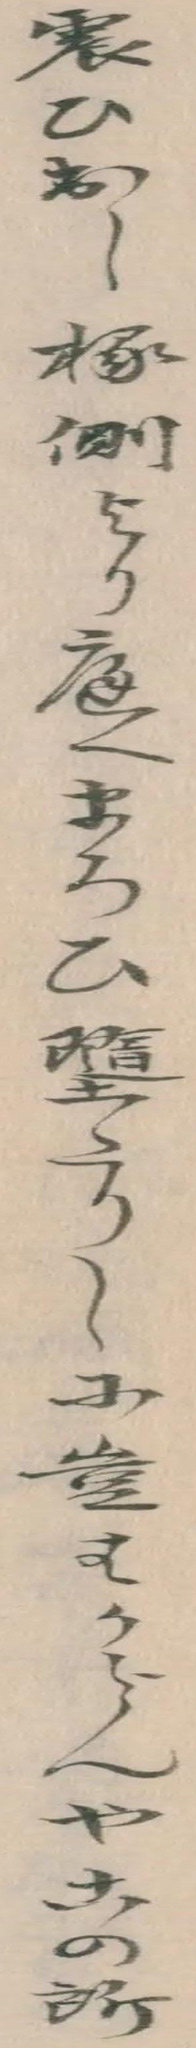震ひ出し縁側より庭へまろひ堕たりしに豈はからんやこの所
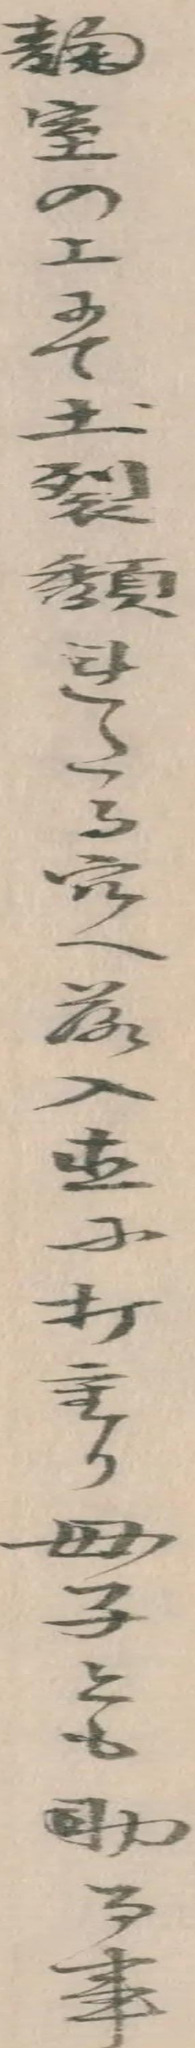麹室の上にて土裂頽れたる穴へ落入直に打重り母子とも助る事
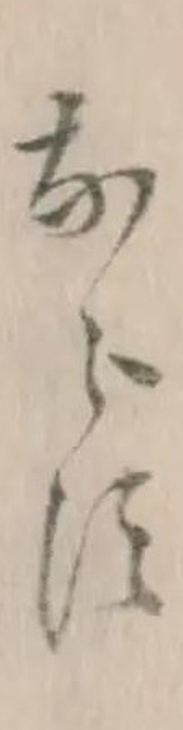ならす
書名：地災撮要. 巻7-9(地震之部)
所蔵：国立国会図書館 National Diet Library, JAPAN
